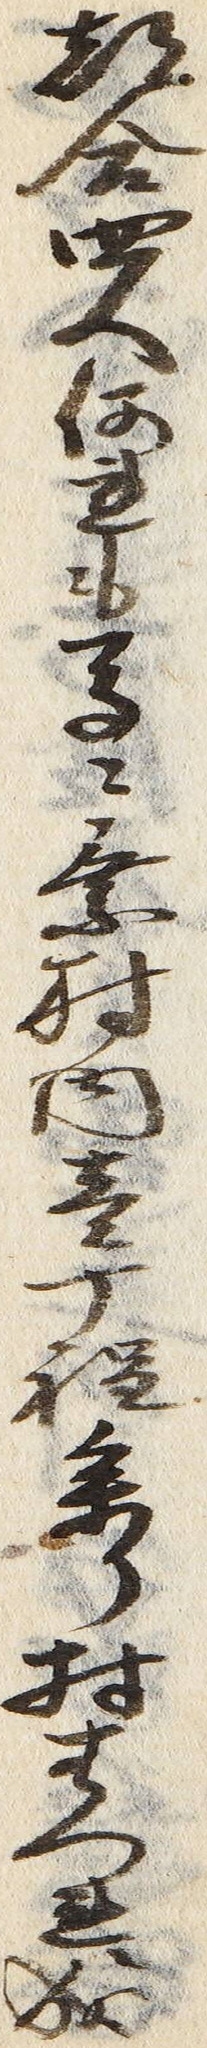都合四人何れも馬ニ乗村内壱丁程参り村はつれニ成
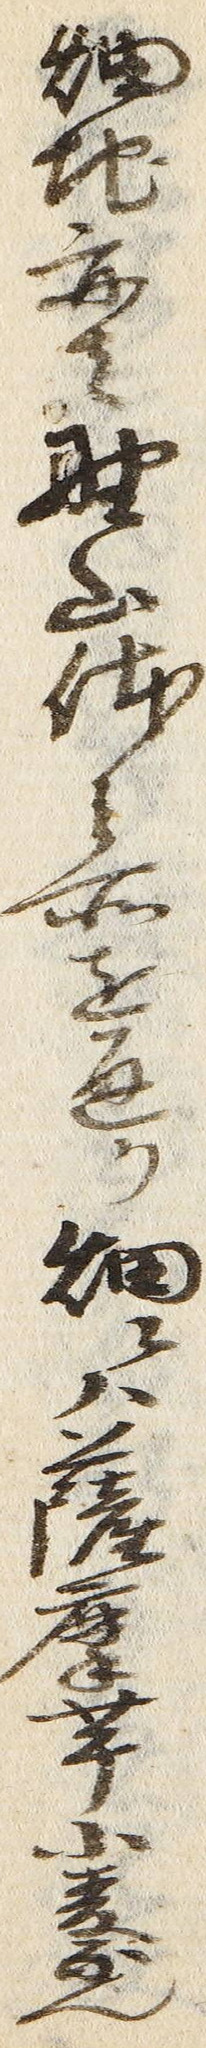畑地亦者野山体之所を通り畑ニハ薩摩芋小麦なん
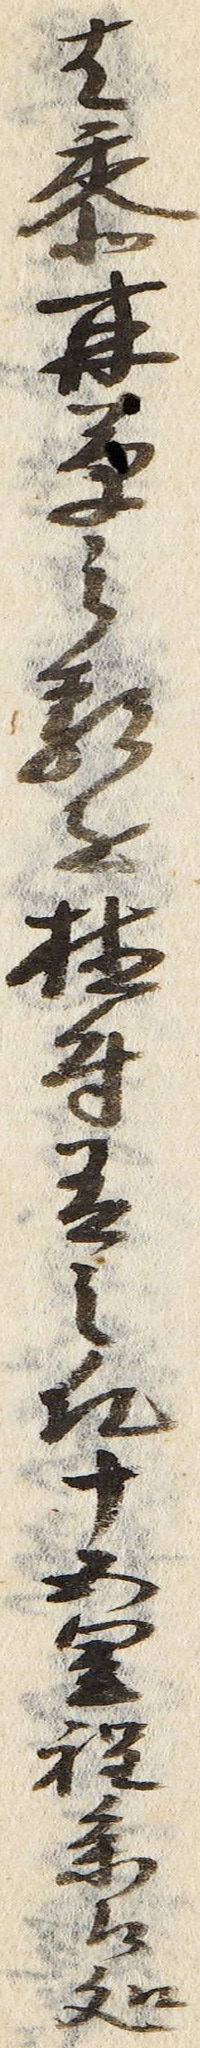は黍甘草之類を植付有之凡十五里程参候処
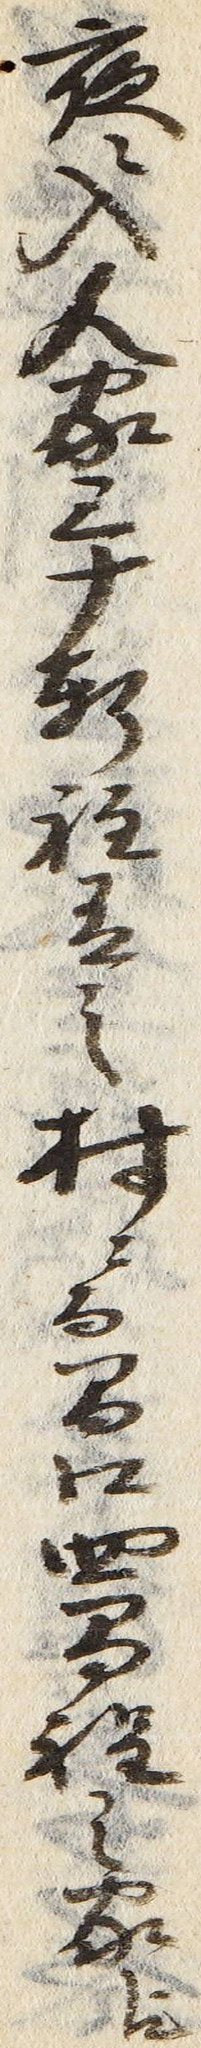夜ニ入人家三十軒程有之村ニ而間口四間程之家江
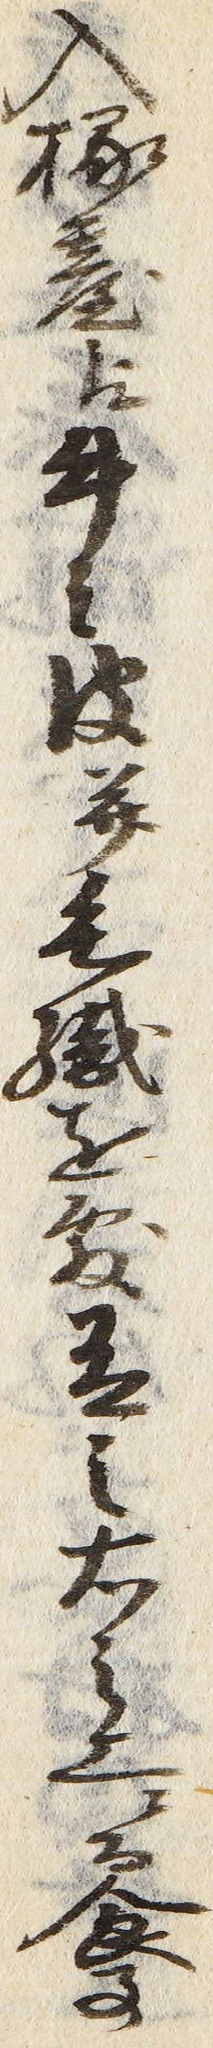入椽臺江牛之皮幷毛織を敷有之右之上ニ而食事
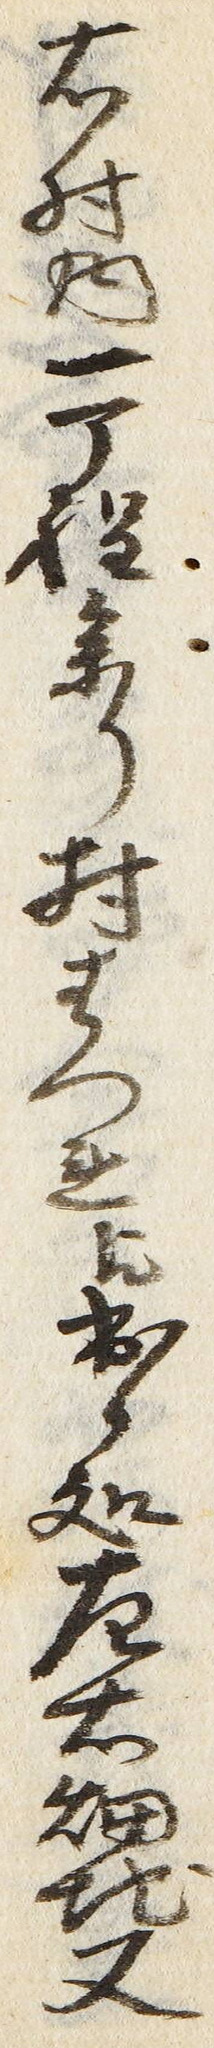右村内一丁程参り村はつれ江出候処左右畑地又
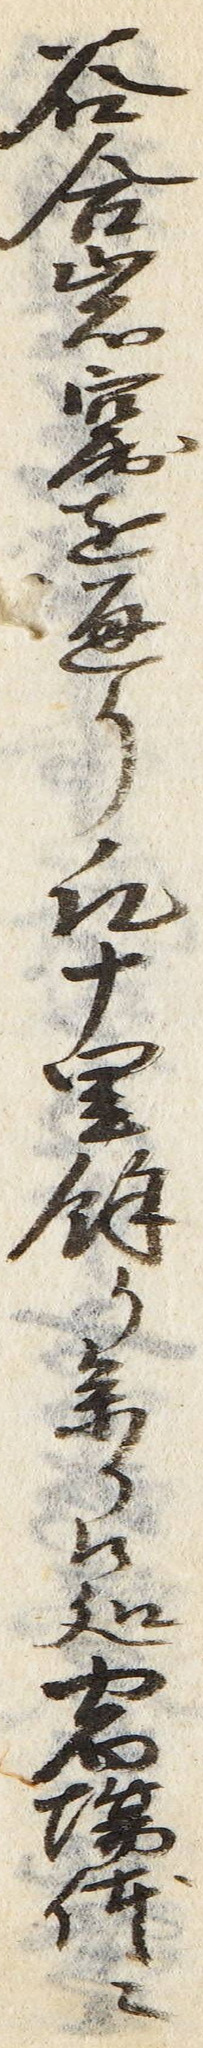谷合岩窟を通り凡十里餘り参り候処宿塲体ニ
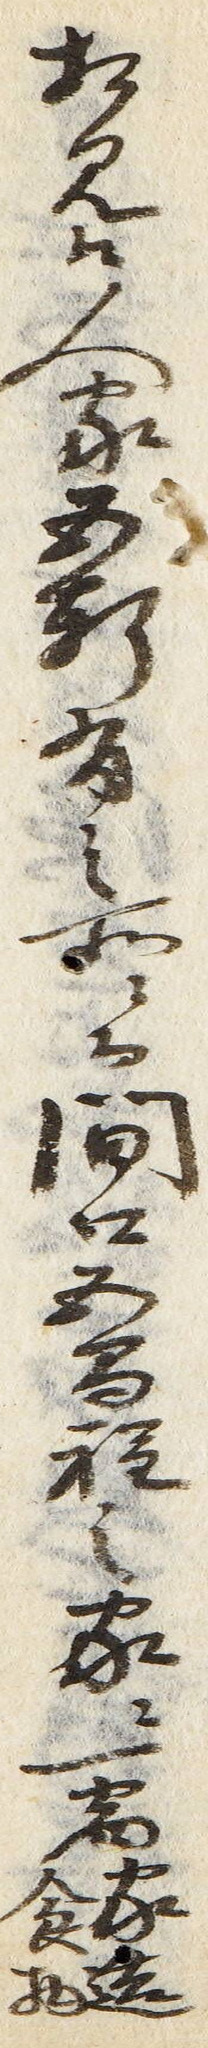相見候人家五軒有之所ニ而間口五間程之家ニ一宿家造食物
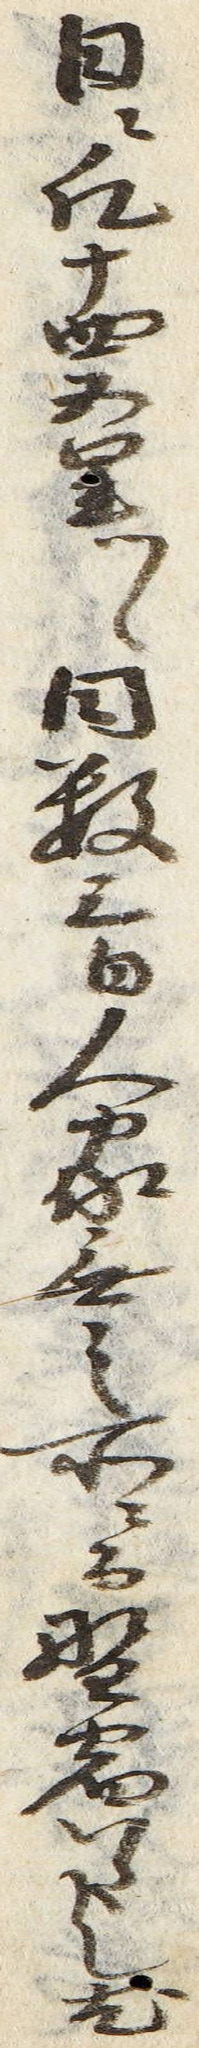日ニ凡十四五里ツヽ日数三日人家無之所ニ而野宿いたし尤

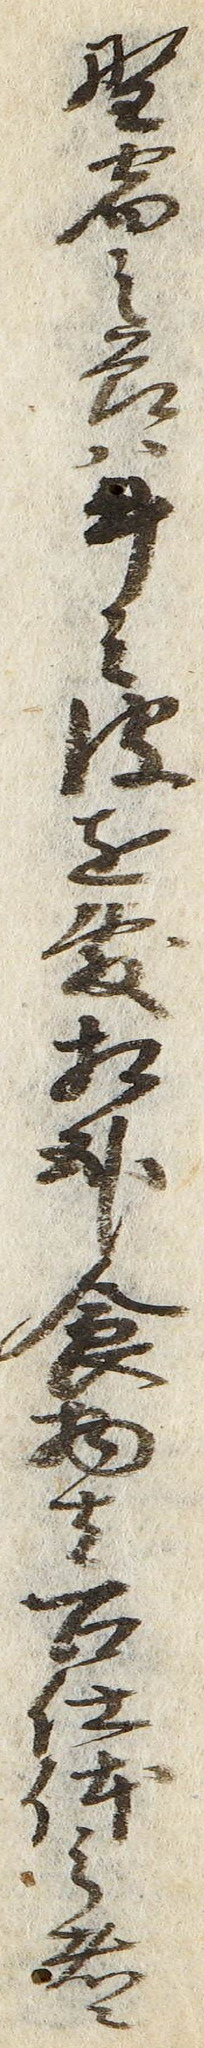野宿之節ハ牛之皮を敷相臥食物者召仕体之者ニ
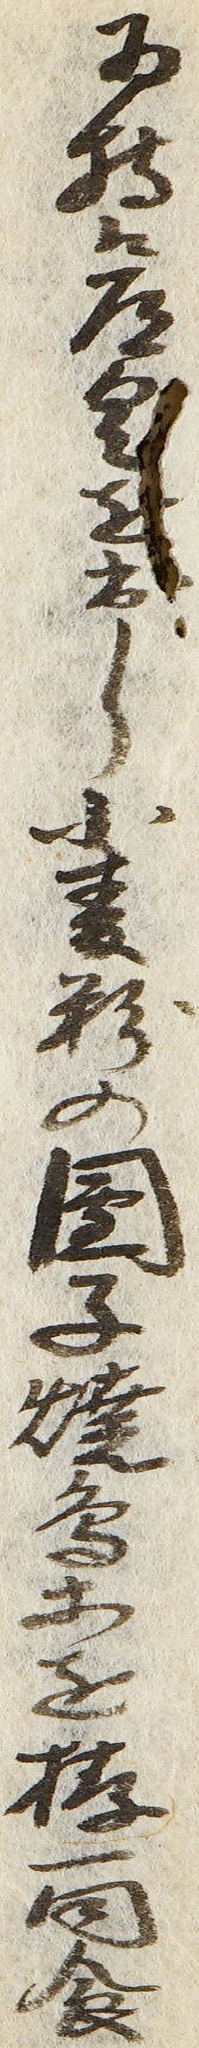為持候道具を出し小麦粉の團子燒鳥等を拵一同食
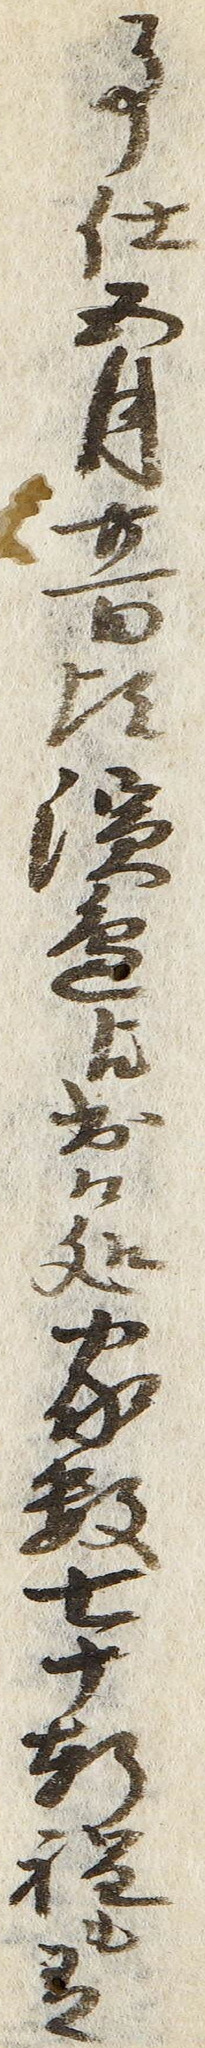事仕五月廿一日頃濱邊江出候処家数七十軒程も有
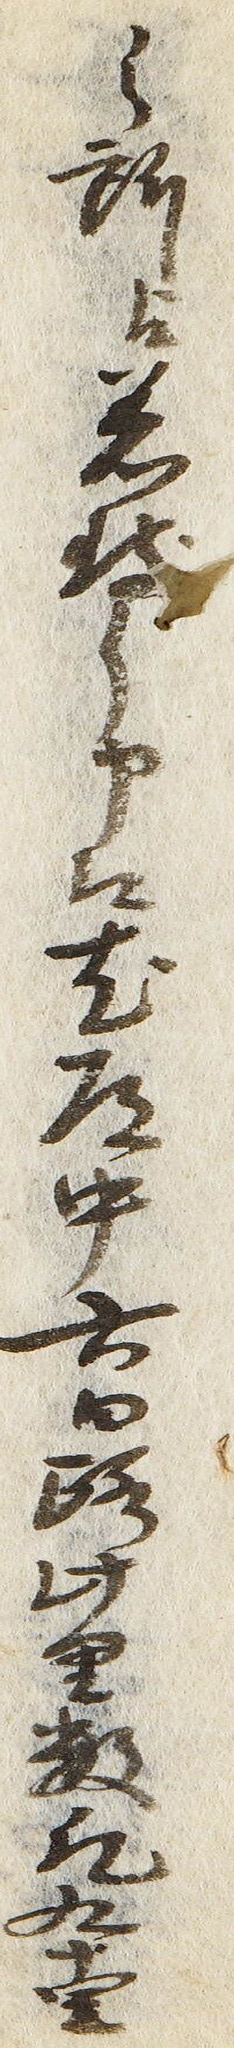之所江着致し申候尤道中六日路此里数凡九十里
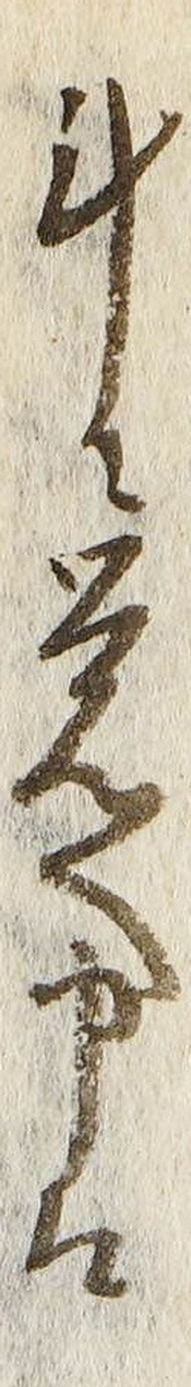斗ニ覚へ申候
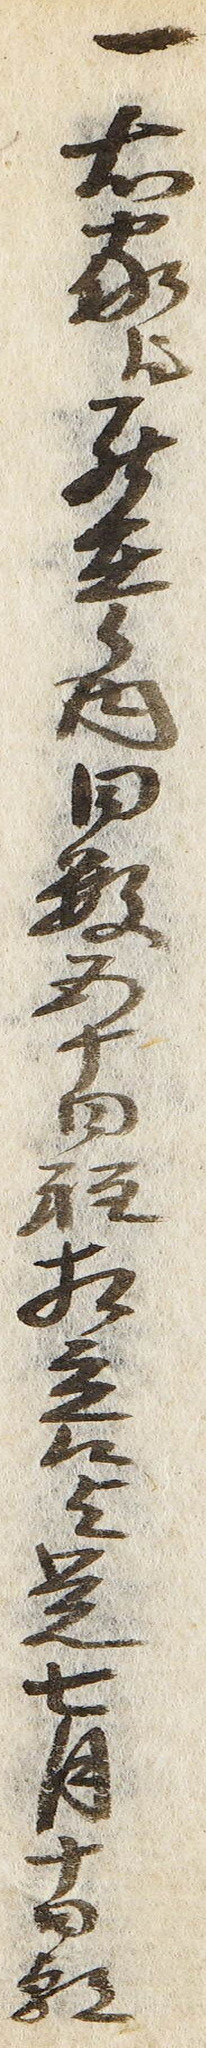一右家江罷在之内日数五十日程相立候と覚七月十日朝
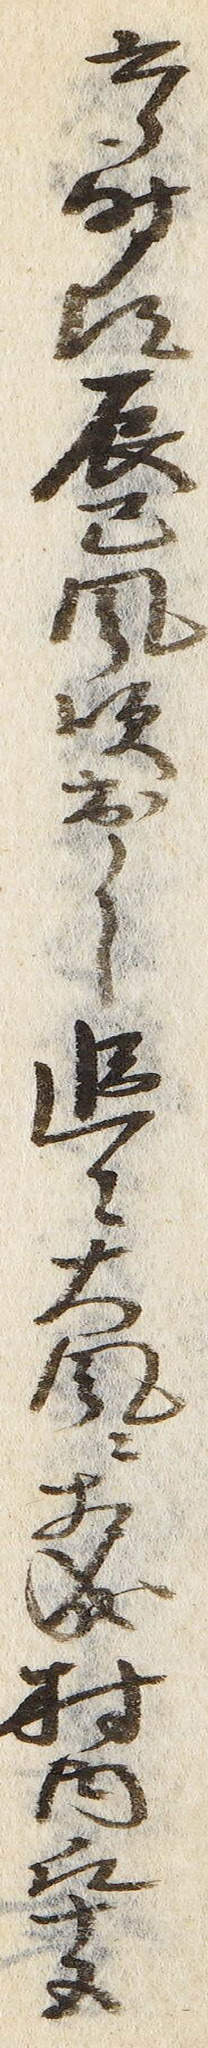六ツ時頃辰巳風吹出し追々大風ニ相成村内凡十五
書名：漂流人善助聞書
